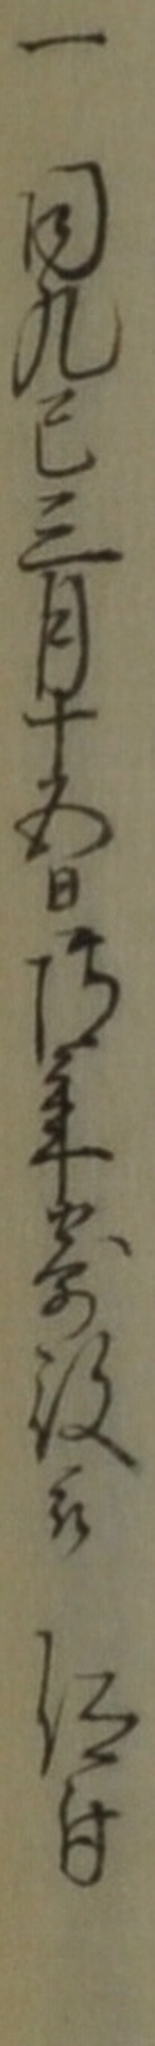一同九巳三月十五日御年寄役被仰付
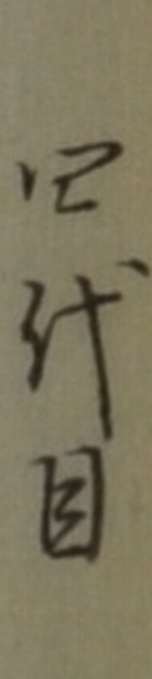四代目
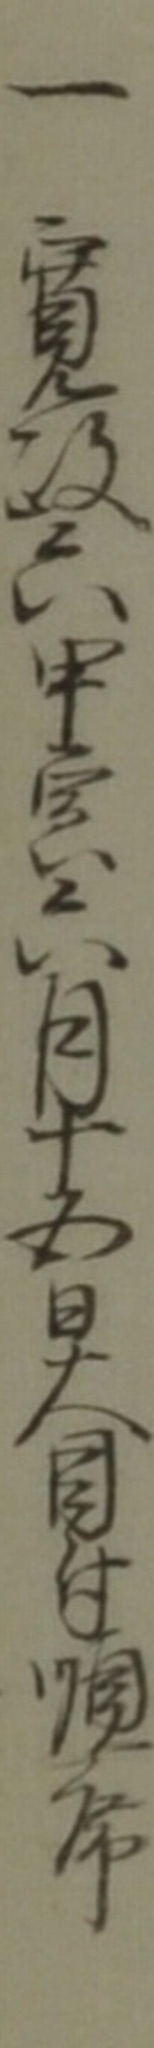一寛政六甲寅六月十五日大目付順席
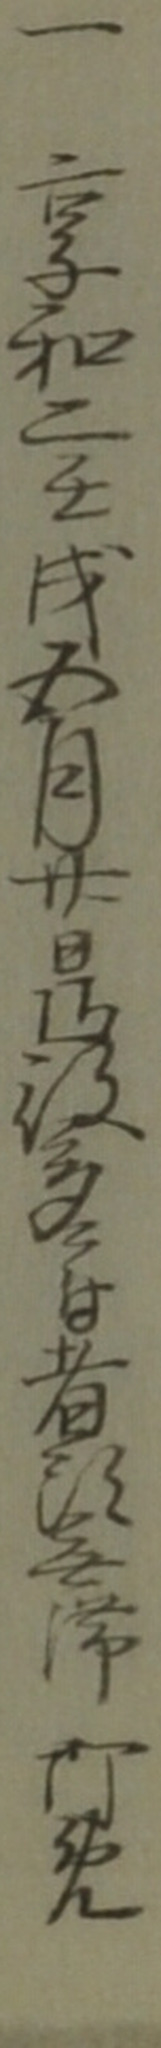一享和二壬戌五月廿日御役多ニ付者頭無滞御免
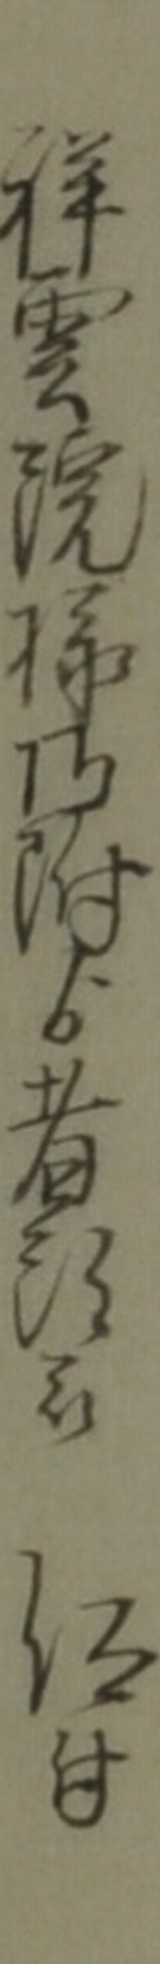祥雲院様御附ゟ者頭被仰付
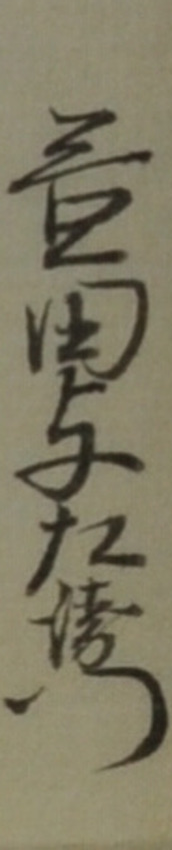益田与左衛門
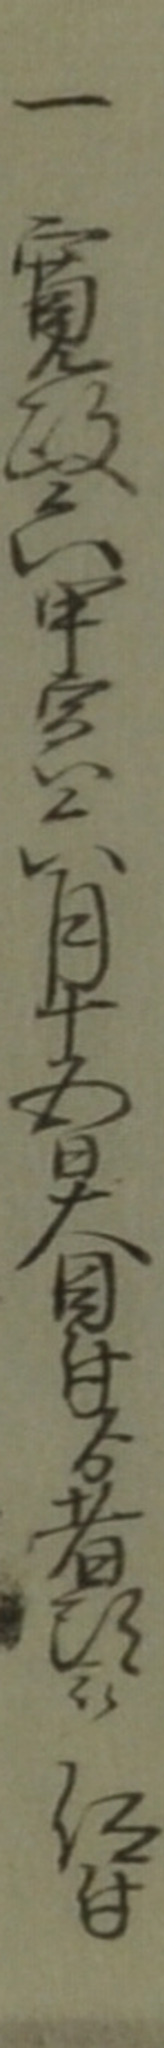一寛政六甲寅六月十五日大目付ゟ者頭被仰付
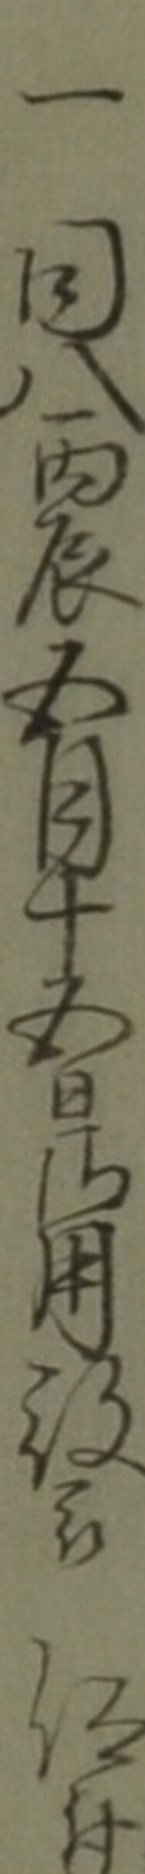一同八丙辰五月十五日御用役被仰付
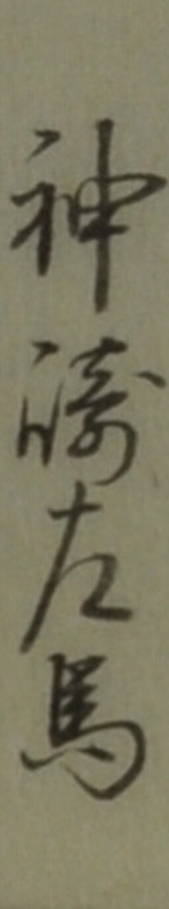神崎左馬
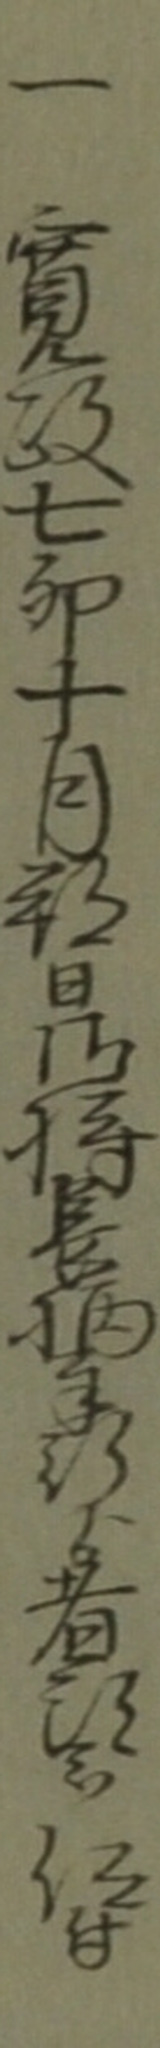一寛政七卯十月朔日御持長柄奉行ゟ者頭被仰付
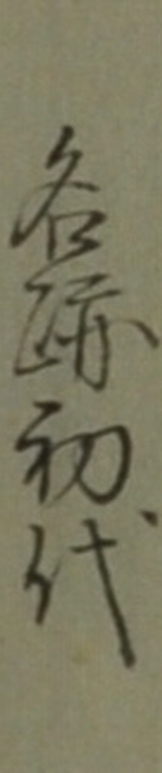名跡初代
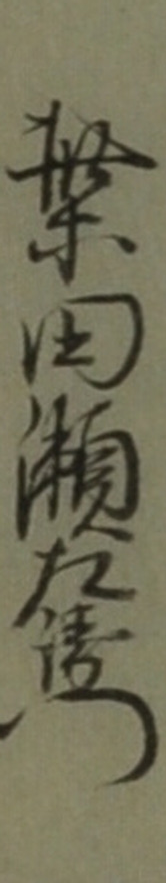柴田瀬左衛門
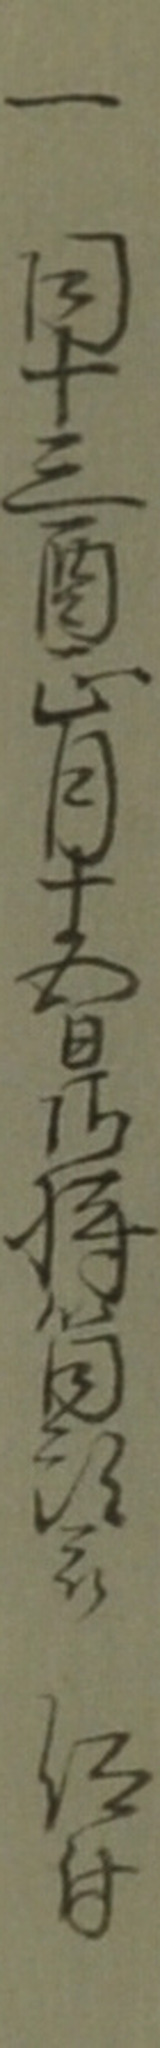一同十三酉正月十五日御持筒頭被仰付
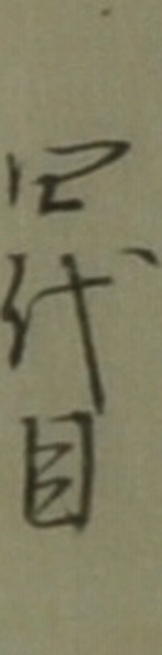四代目
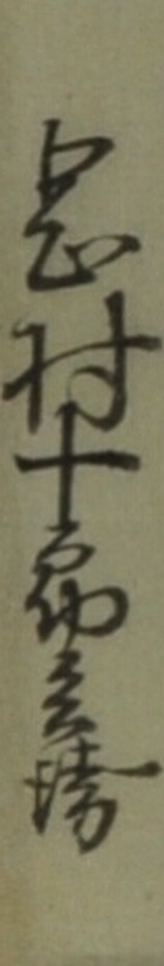岡村十郎兵衛
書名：諸御役代々録（二）
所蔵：伊那市立高遠町図書館・合同会社AMANE
